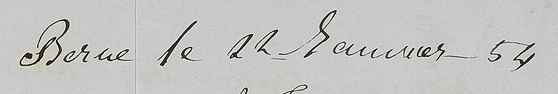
Berne le 22 Janvier 54
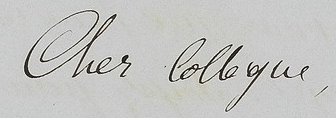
Cher Collègue,
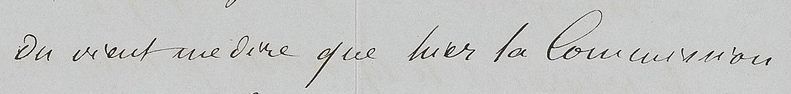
on vient me dire que hier la Commission
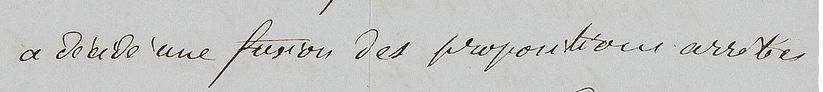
a décidé une fusion des propositions arrêtées
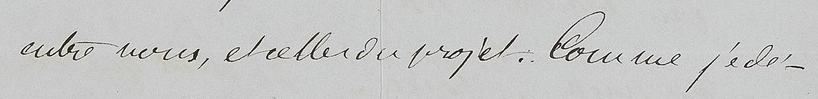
entre nous, et celles du projet. Comme je dé-
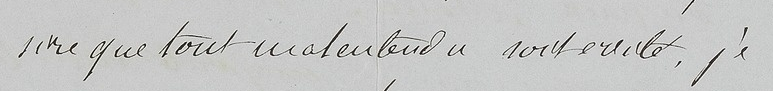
sire que tout malentendu soit évité, je
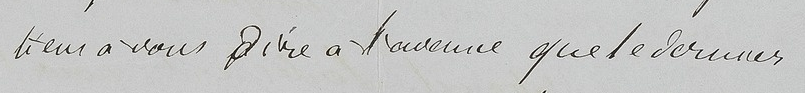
tiens à vous dire à l'avance que le dernier
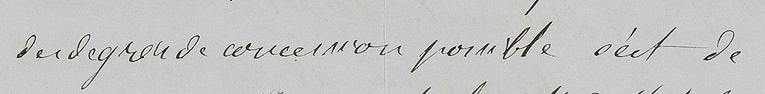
des degrés de concession possible c'est de
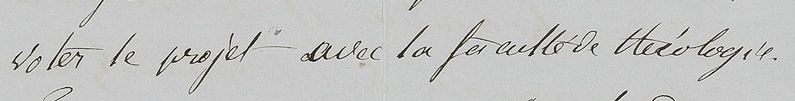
voter le projet avec la faculté de théologie.
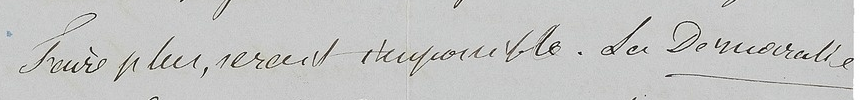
Faire plus, serait impossible. La Démocratie
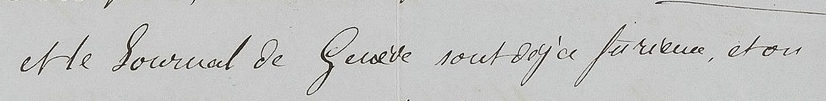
et le Journal de Genève sont déjà furieux, et on
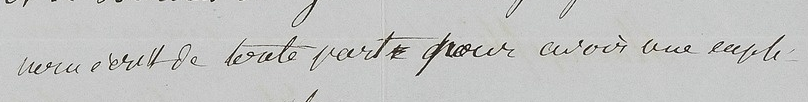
nous écrit de toute part pour avoir une expli-
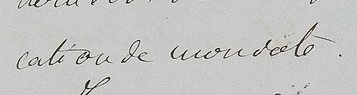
cation de mon vote.
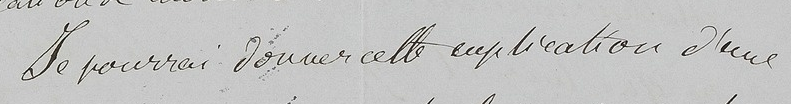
Je pourrais donner cette explication d'une
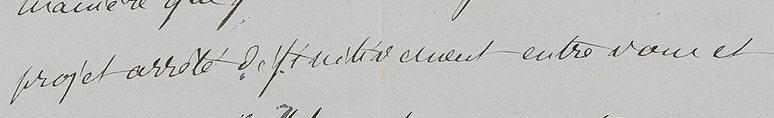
projet arrêté définitivement entre vous et
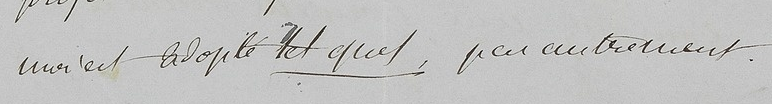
moi est adopté tel quel, pas autrement.
